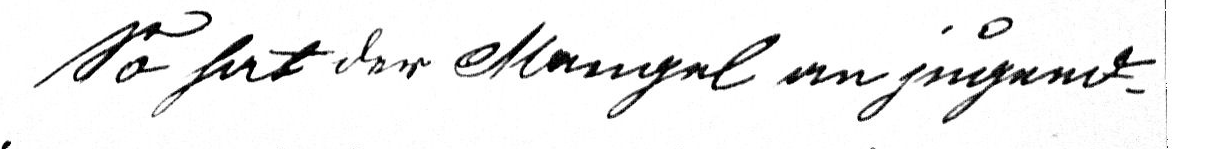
So hat der Mangel an jugend¬
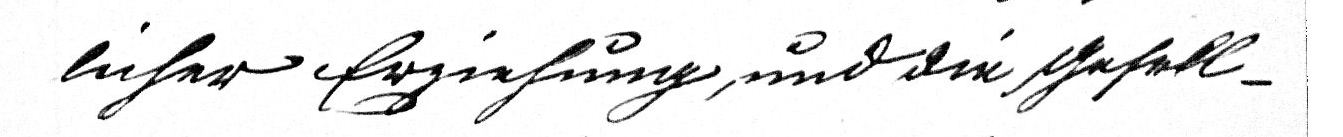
licher Erziehung, und die Gesell¬
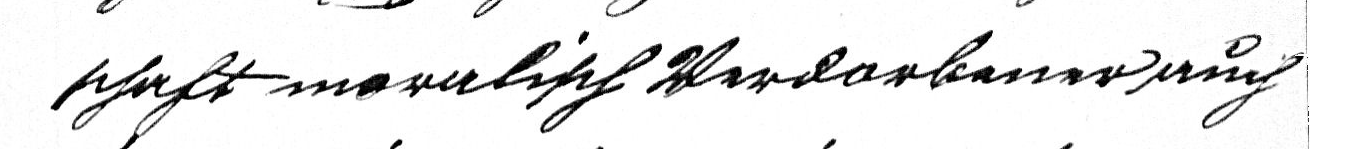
schaft moralisch Verdorbener auch
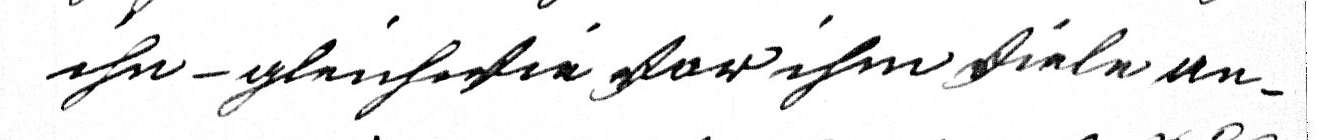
ihn - gleichwie vor ihm viele an¬
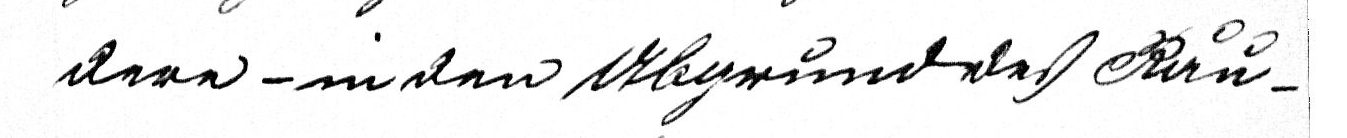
dere - in den Abgrund des Rau¬
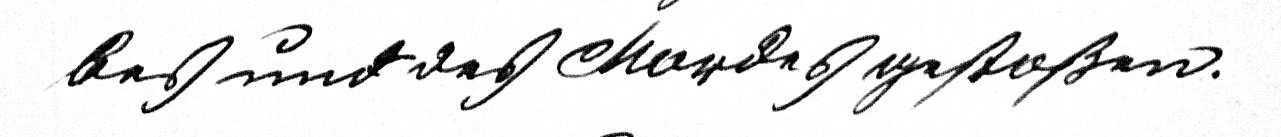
bes und des Mordes gestoßen.
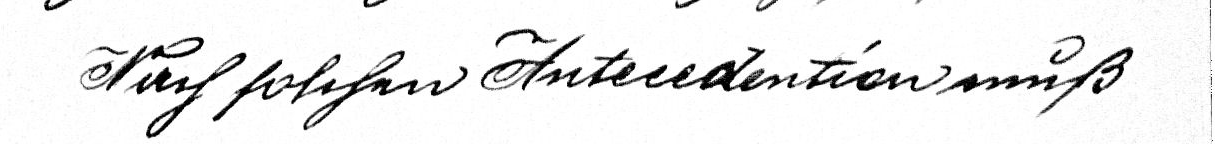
Nach solchen Antecedention muß
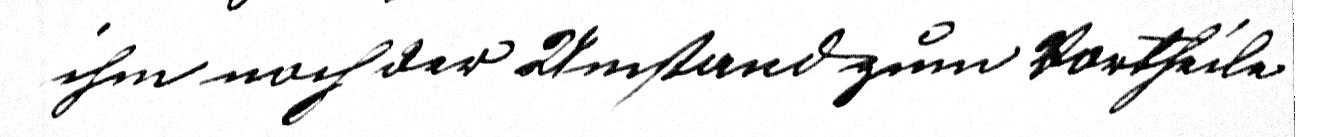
ihm nach der Umstand zum Vortheile
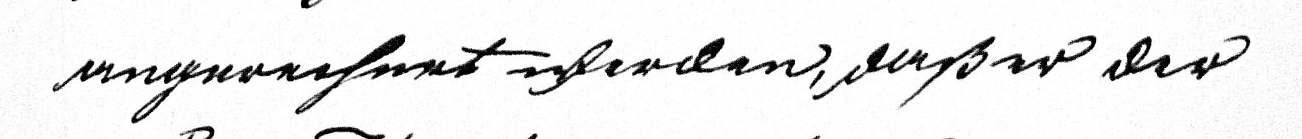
angerechnet werden, daß er der
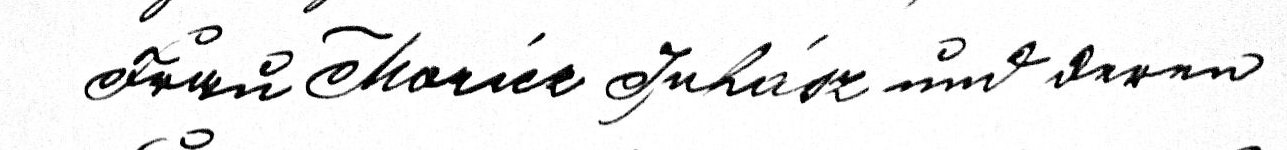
Frau Moricz Inhász und deren
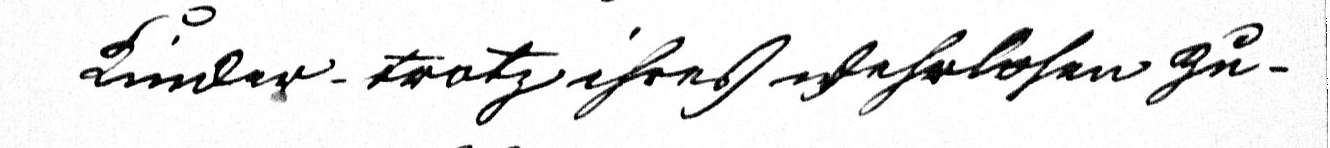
Kinder - trotz ihres wehrlosen Zu¬
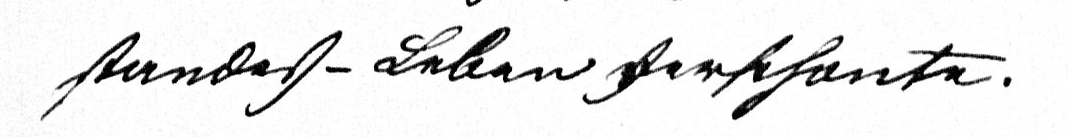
standes - Leben verschonte.
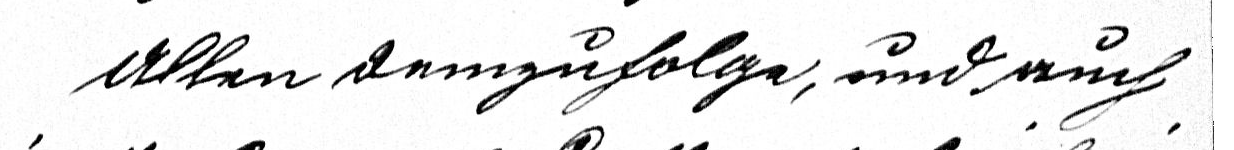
Allen demzufolge, und auch
